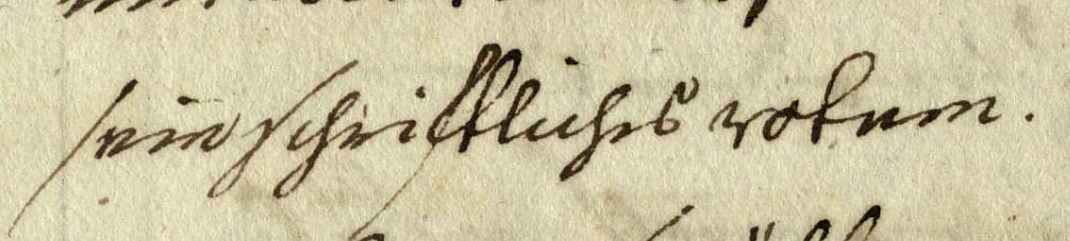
sein schriftliches votum.
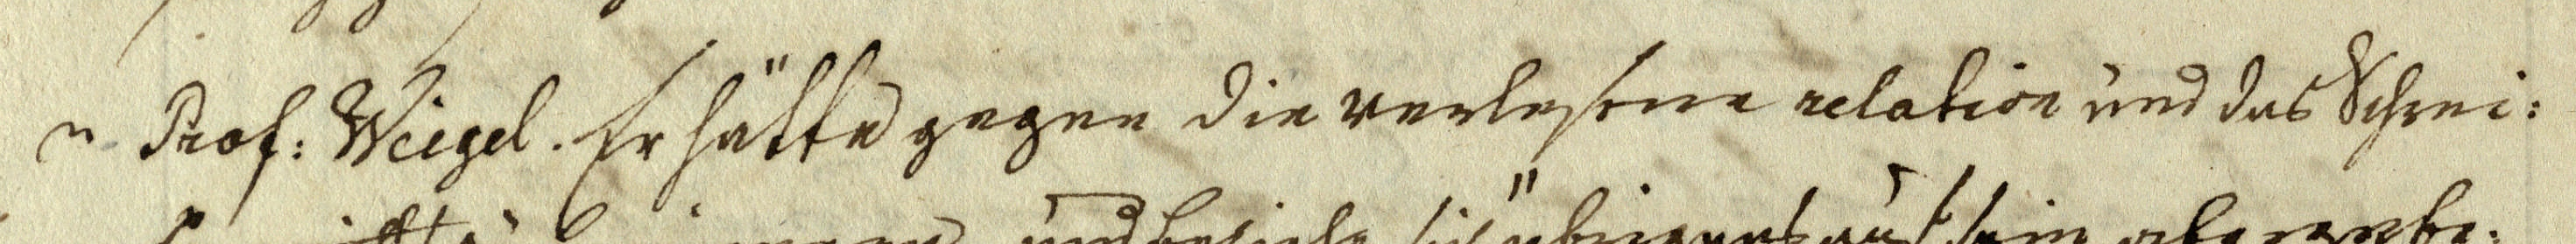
Prof. Weigel. Er hätte gegen die verlesene relation und das Schrei¬
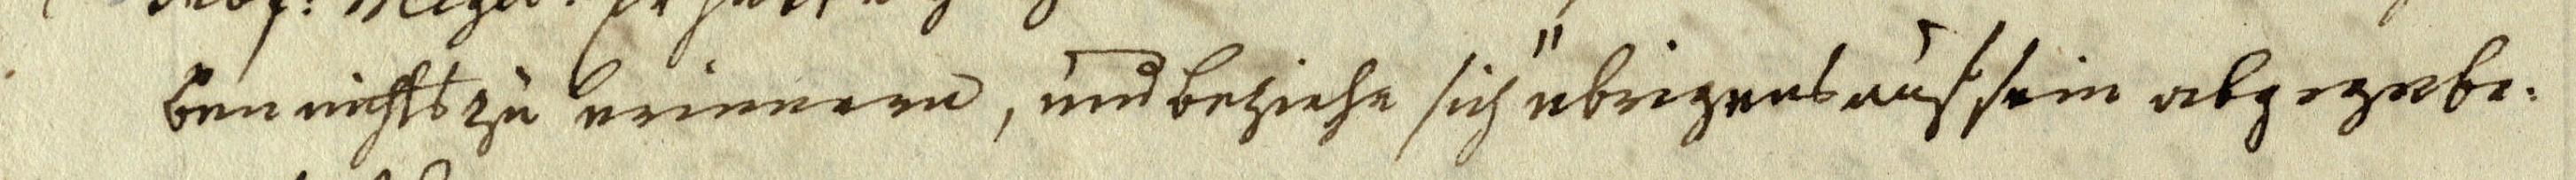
ben nichts zu erinnern, und beziehe sich übrigens auf sein abgegebe¬
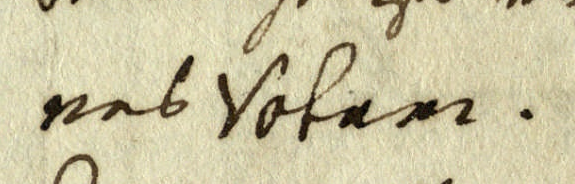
nes Votum.
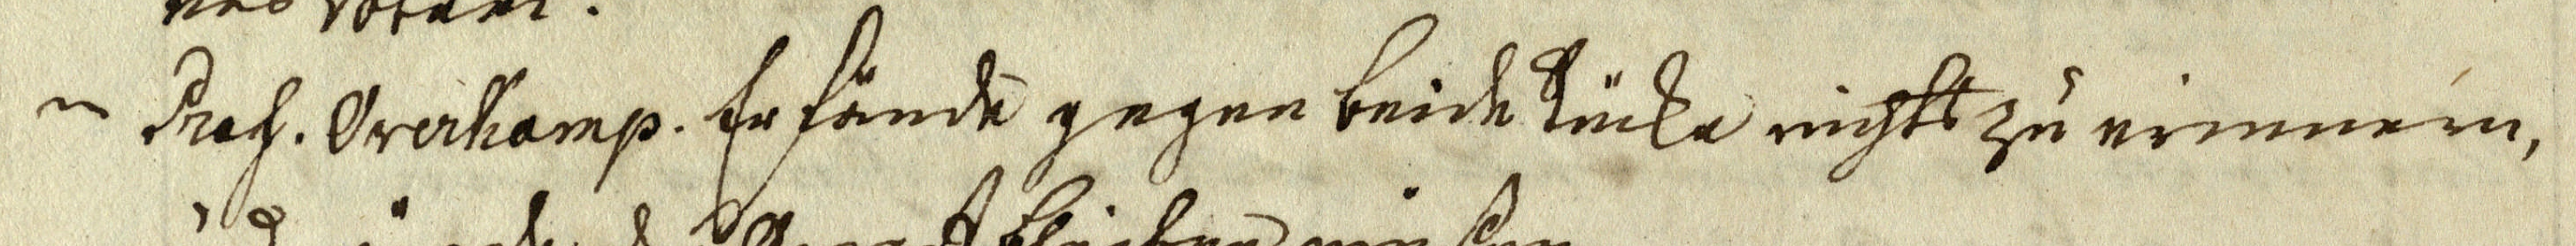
Prof. Overkamp. Er fände gegen beide Stücke nichts zu erinnern,
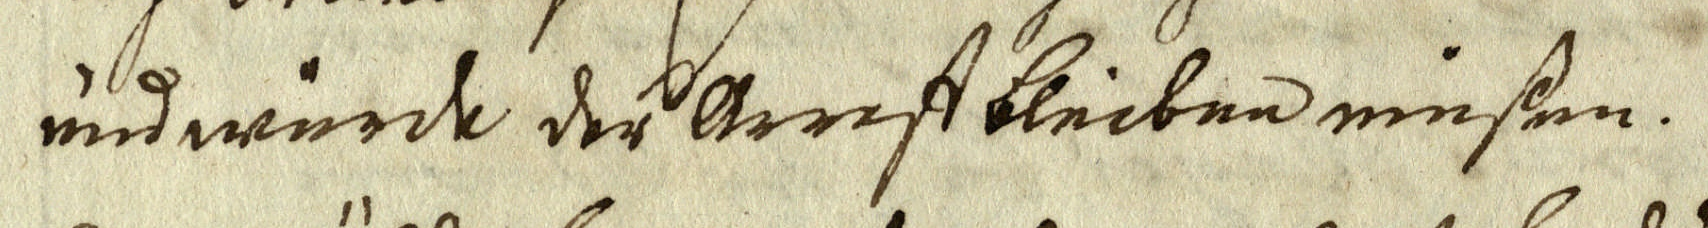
und würde der Arrest bleiben müßen.
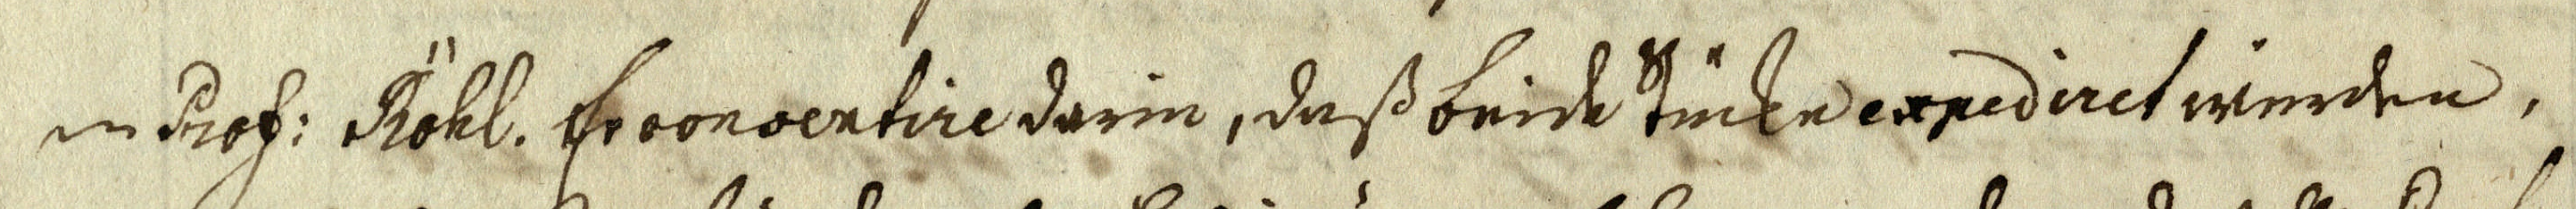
Prof. Röhl. Er consentire darin, daß beide Stücke expediret würden,
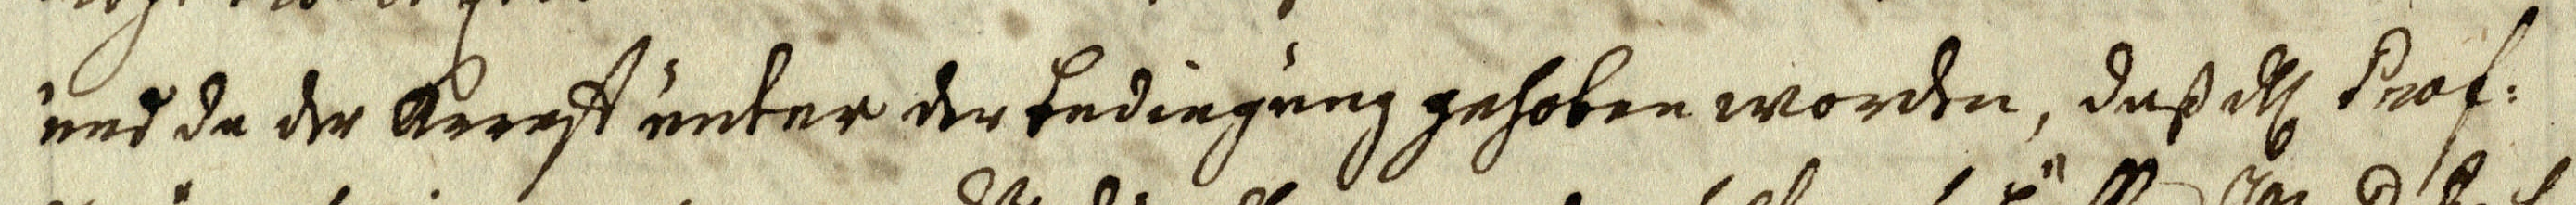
und da der Arrest unter der Bedingung gehoben worden, daß dh Prof.
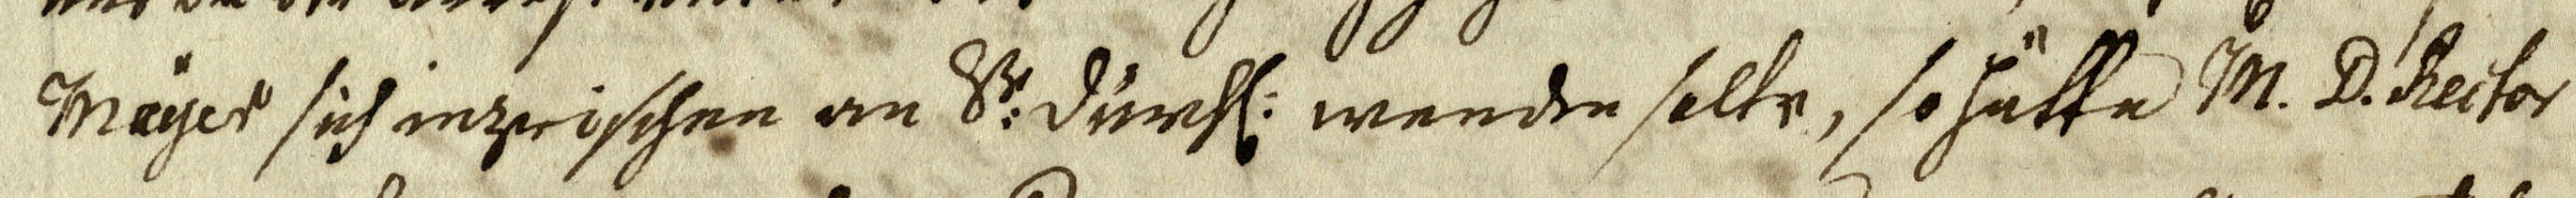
Maÿer sich inzwischen an Sr. Durchl. wenden solte, so hätte M. D. Rector
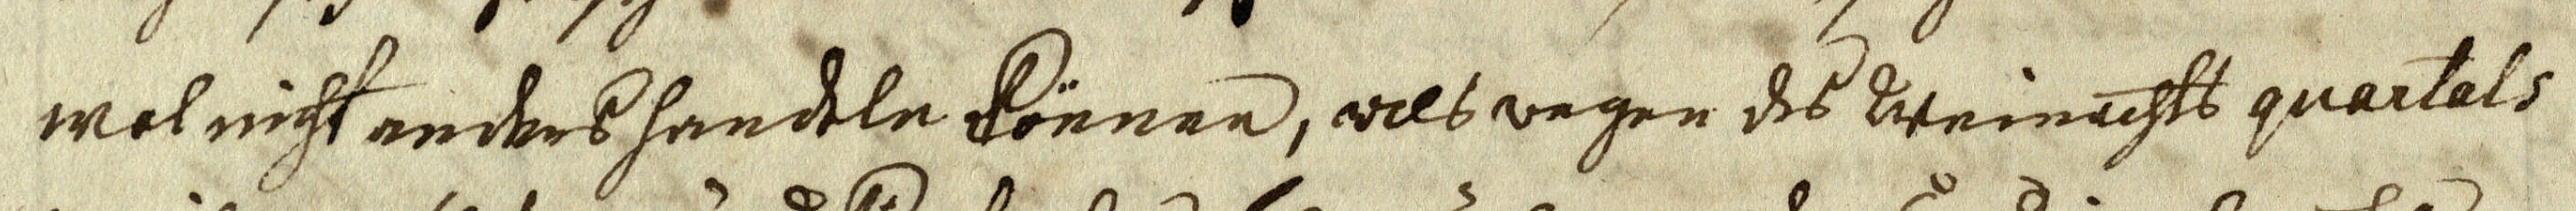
wol nicht anders handeln können, was wegen des Weinachts quartals
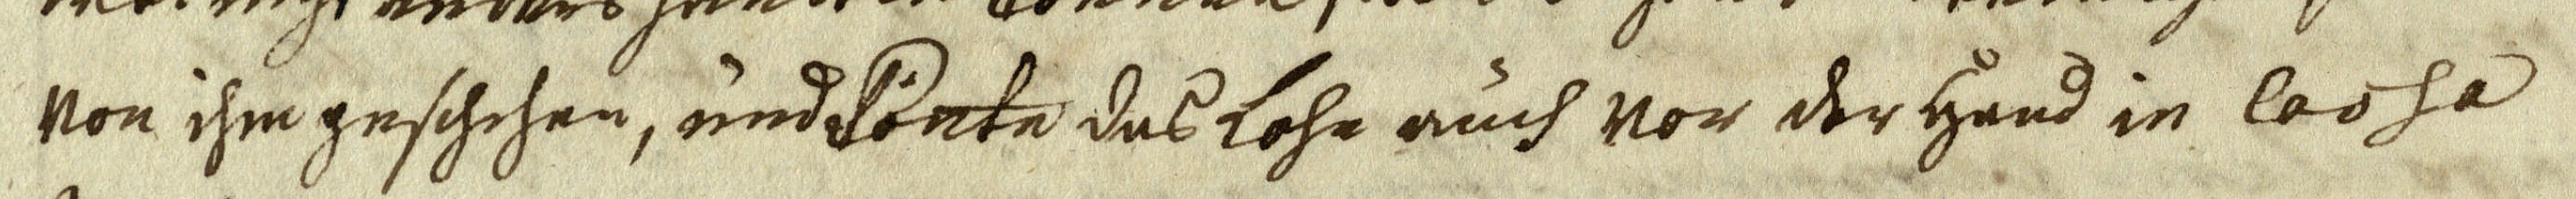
von ihm geschehen,und könte das Lohn auch vor der Hand in Cassa
